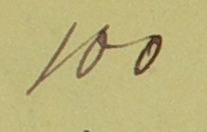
100
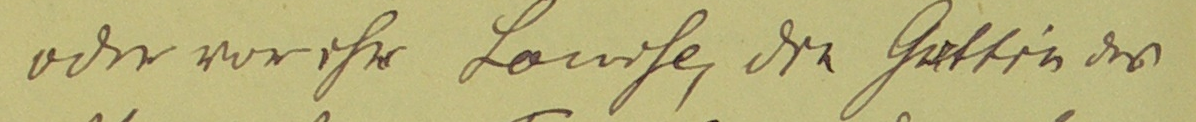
oder vor ihr Louise, die Gattin des
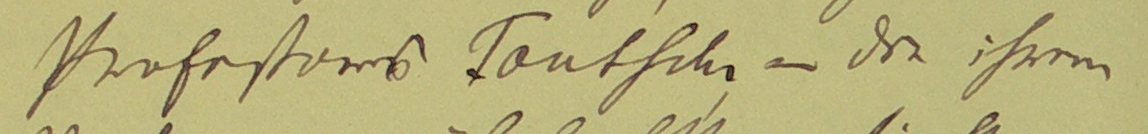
Professors Tontsch- der ihrem
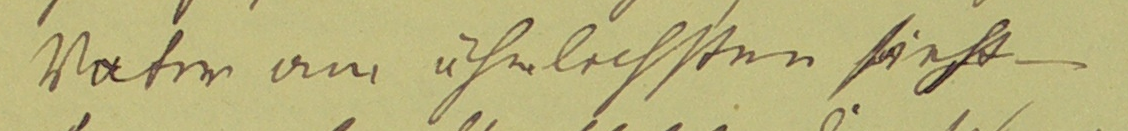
Vater am ähnlichsten sieht.
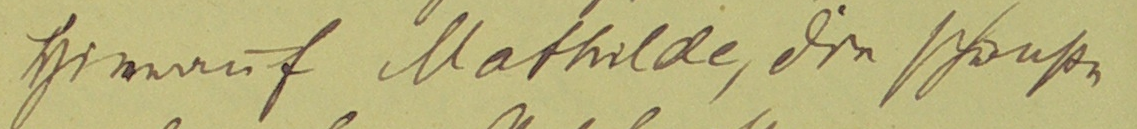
Hierauf Mathilde, die schönste
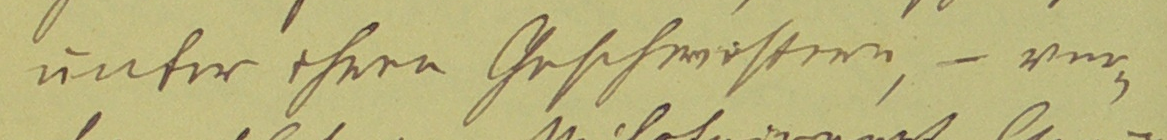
unter ihren Geschwistern, ver¬
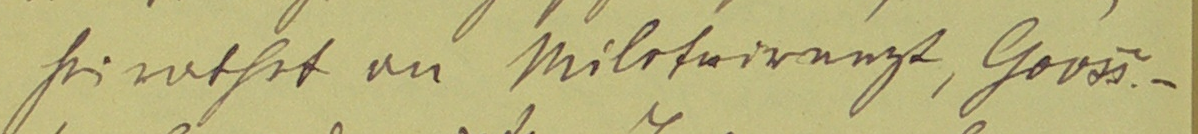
heiratet an Militärarzt Gooss,-
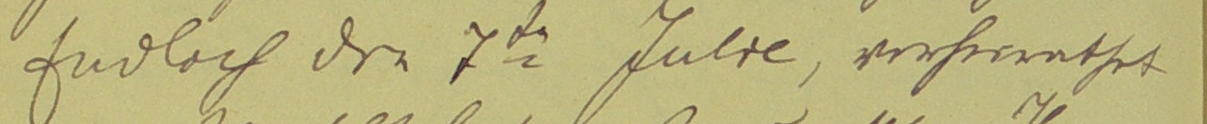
Endlich die 7-te Julie, verheiratete
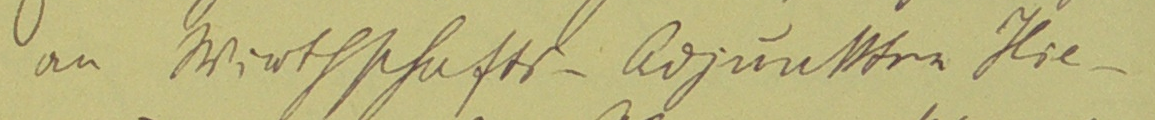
an Wirtschafts-Adjunkten Hie¬
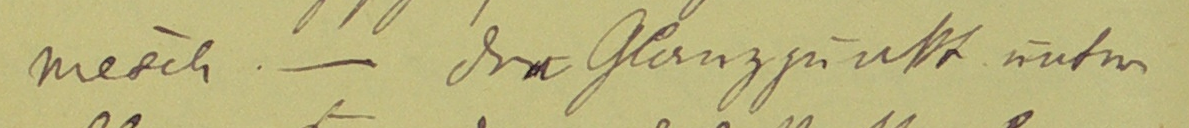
mesch.- Der Glanzpunkt unter
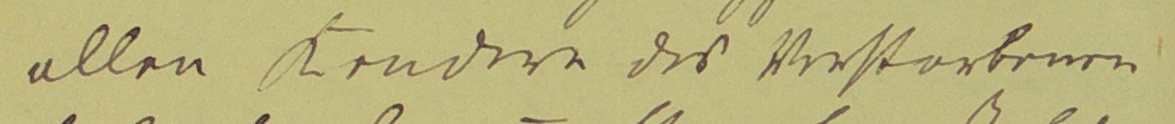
allen Kindern des Verstorbenen
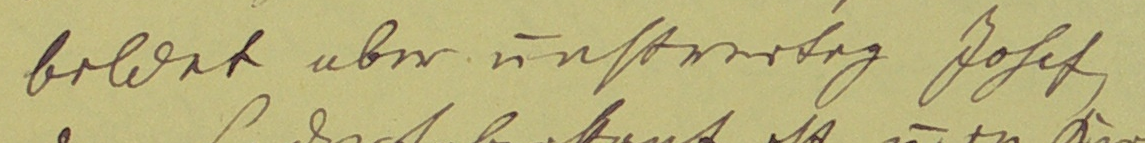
bildet aber unstreitig Josef
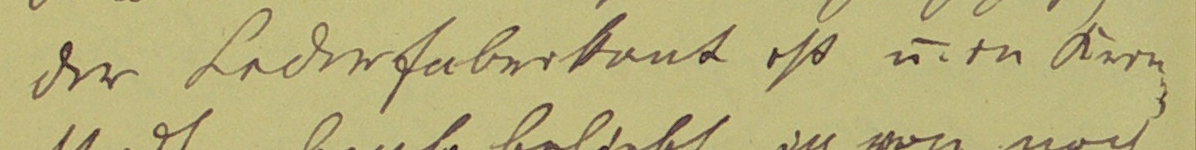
der Lederfabrikant ist und in Kron¬
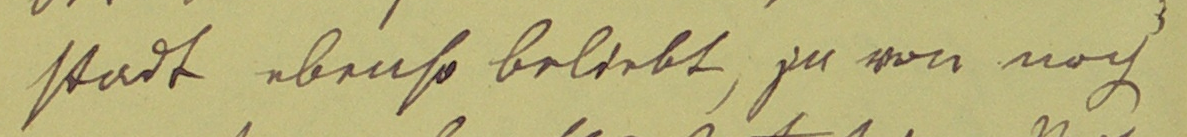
stadt ebenso beliebt ja von noch
